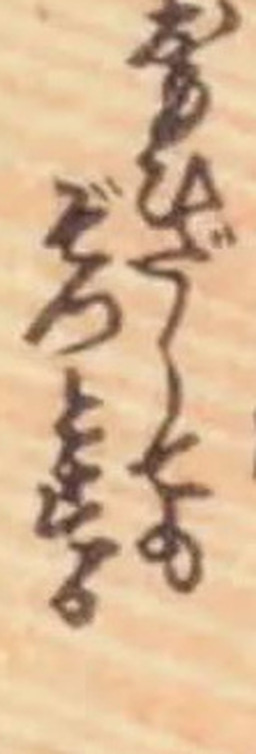ぞつとする
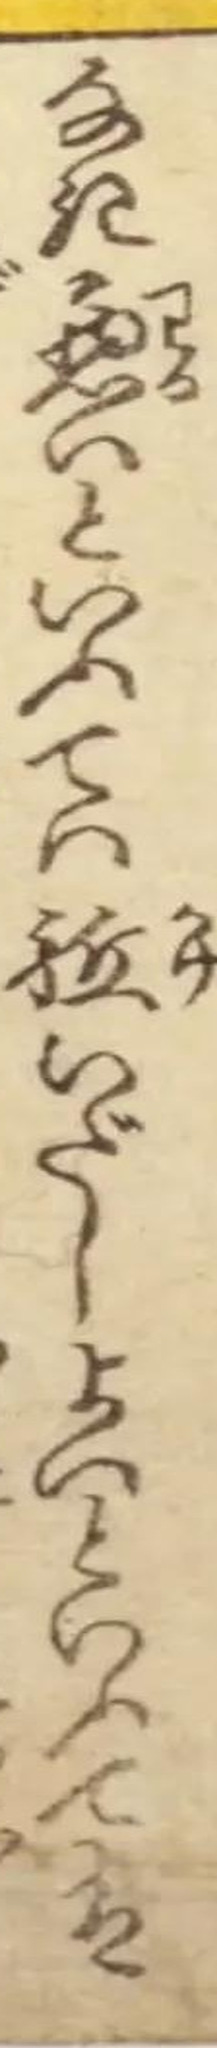なき悪いといふては駈いだしよいといふては
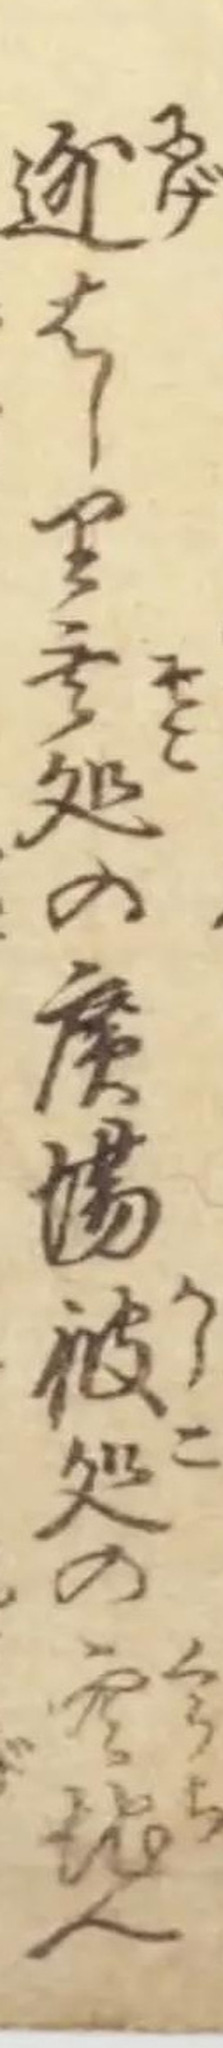迯はしり其処の廣場彼処の空地へ
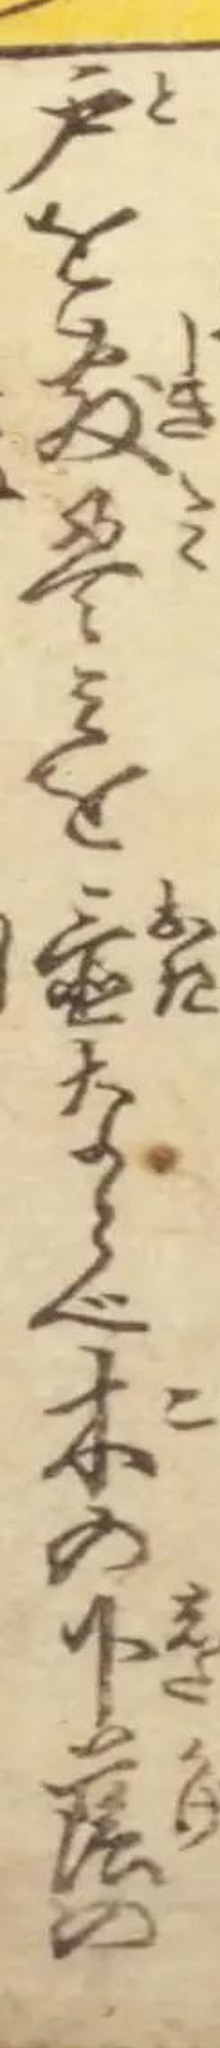戸を敷畳みを置ならべ木の下陰の
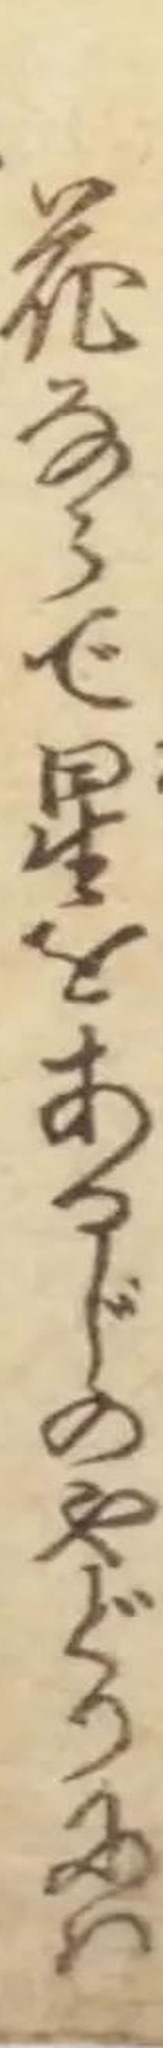花ならで星をあるじのやどりには
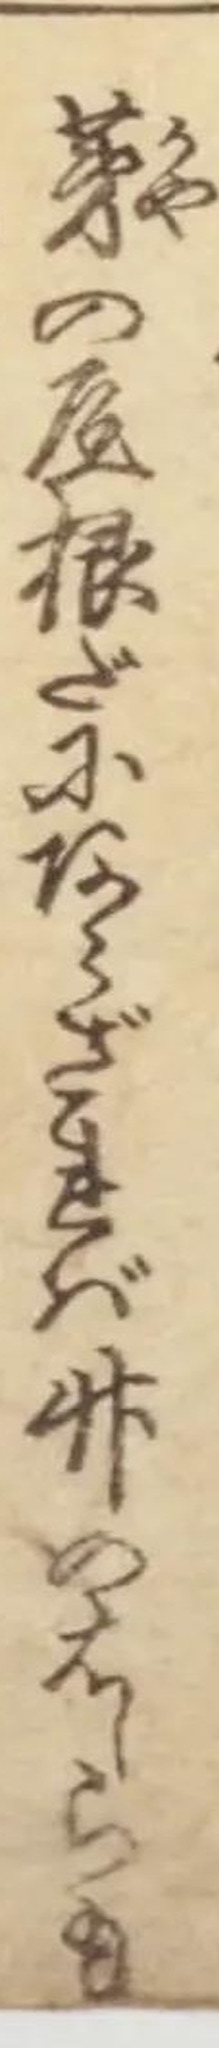茅の屋根だにあらざれば竹のはしらも
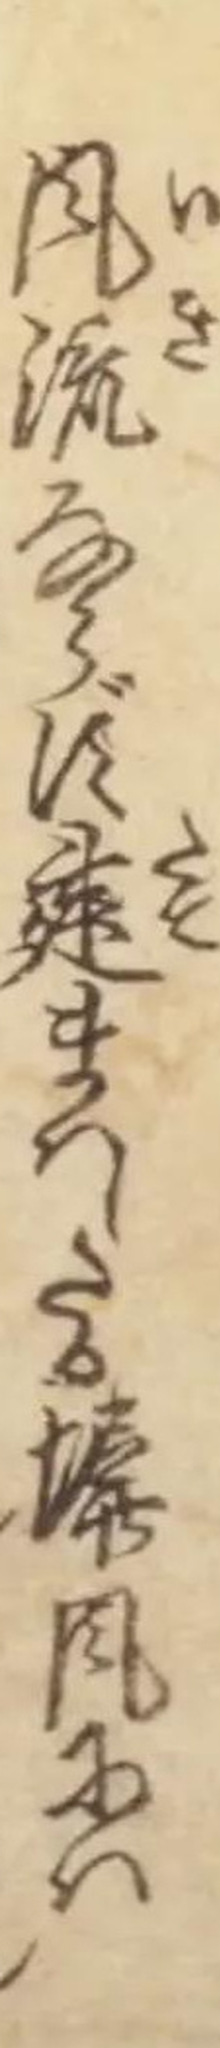風流ならず建まはしたる場屏風には
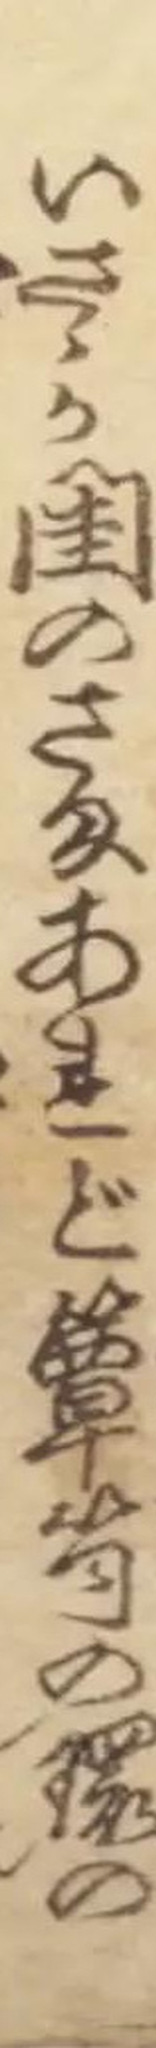いさゝか閨のさまあれど箪笥の環の
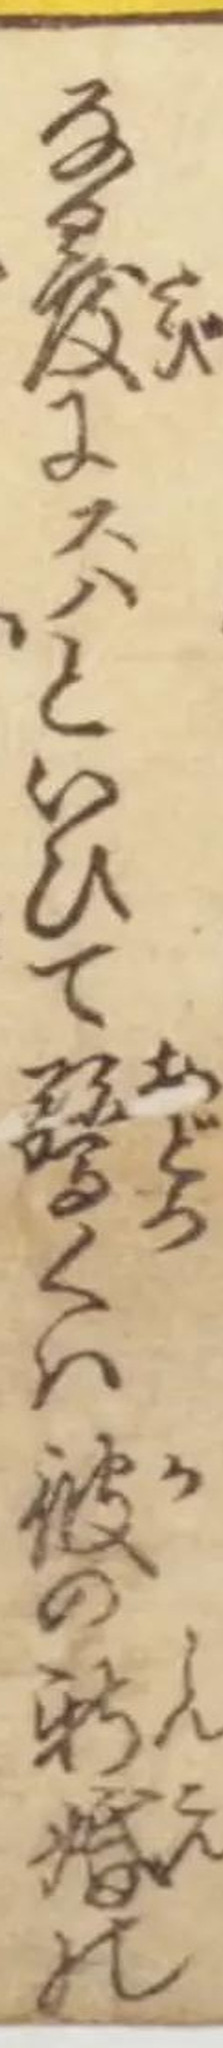なる度にスハといひて驚くは彼の新婚の
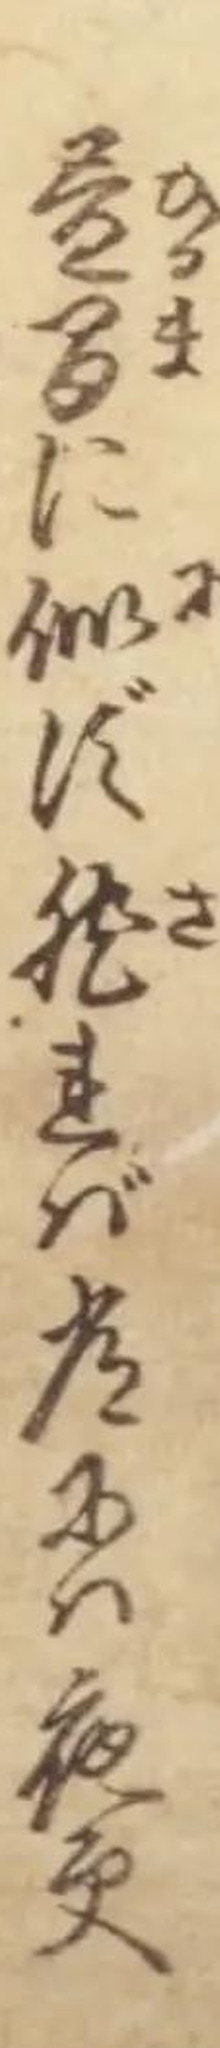昼間に似ず然れば常には夜更
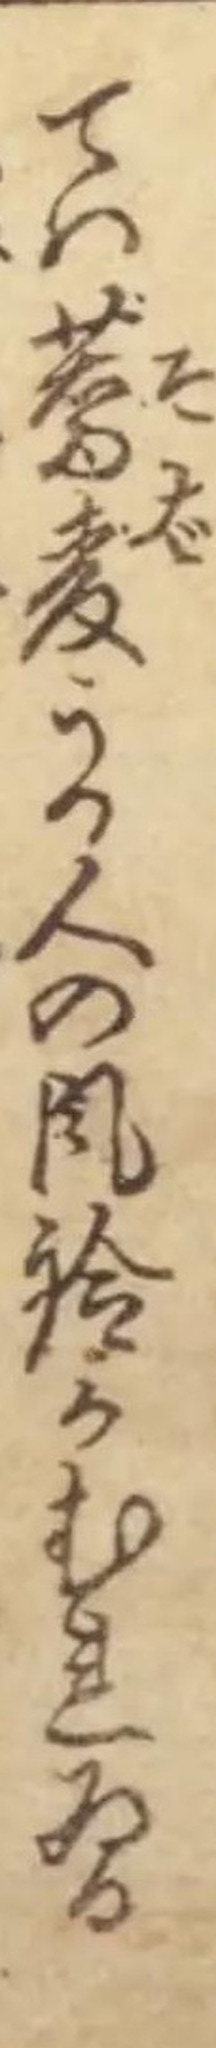ては蕎麦うる人の風鈴かむれゐる
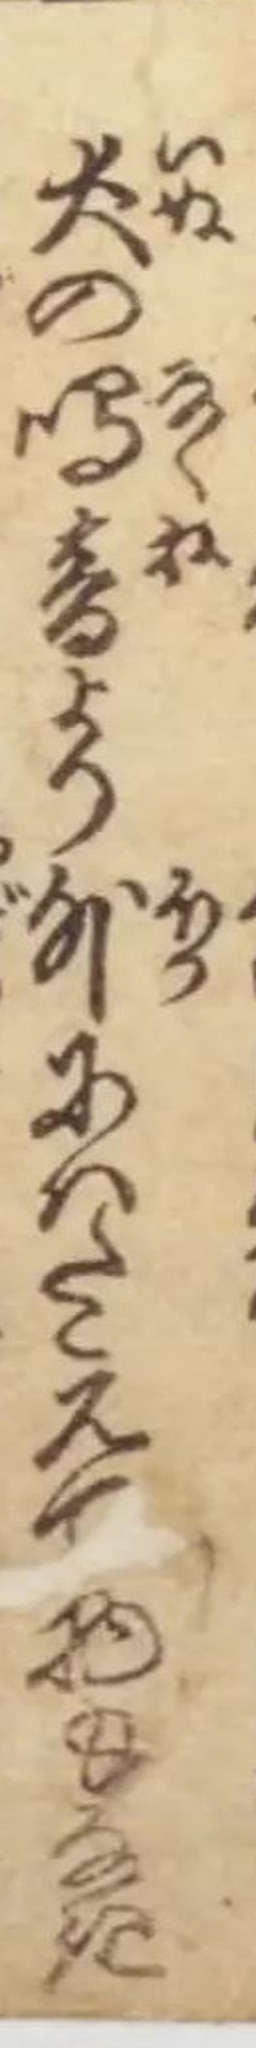犬の鳴音より外にはたえて物もなき
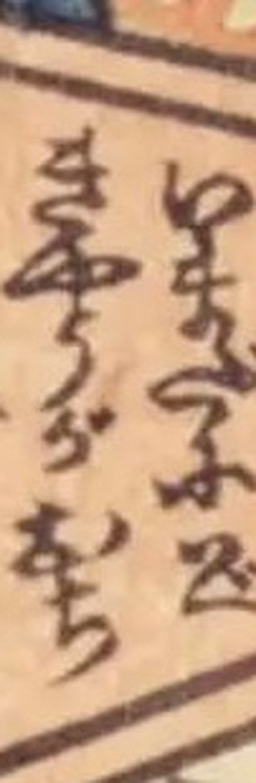きやうがおち
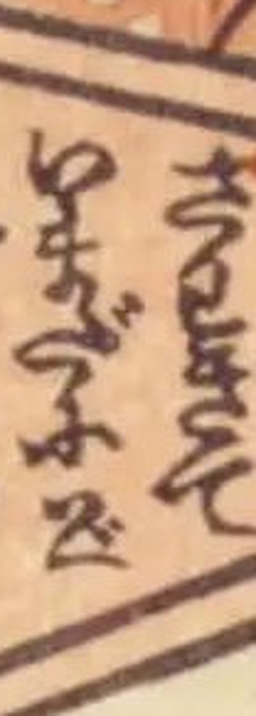いまだにど
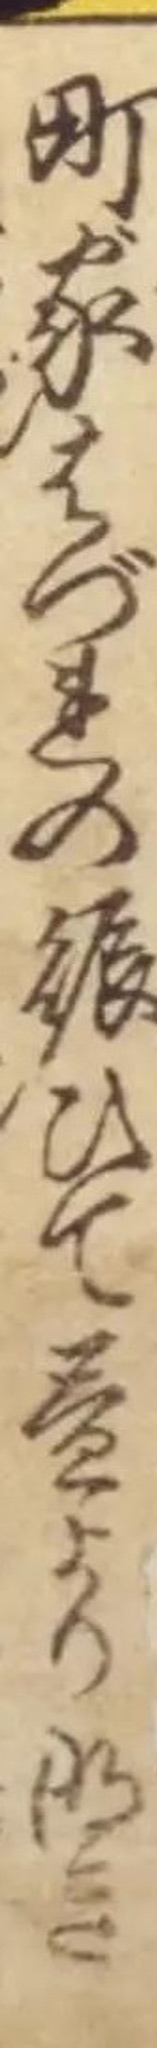町家はづれの賑ひて昼より明き
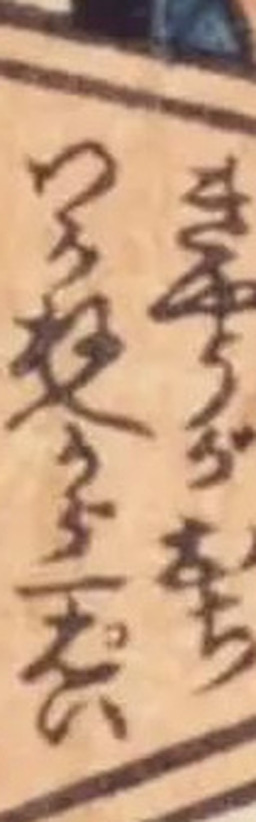つかねへから一ぱい
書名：地震後野宿の図
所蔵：国立国会図書館 National Diet Library, JAPAN
